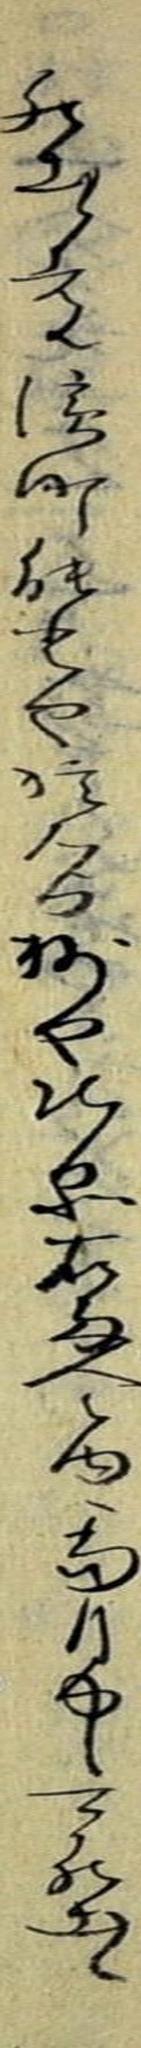罷出候者共浜町能登や猶右衛門柳や次兵衛右両人之内へ当月中可罷出候
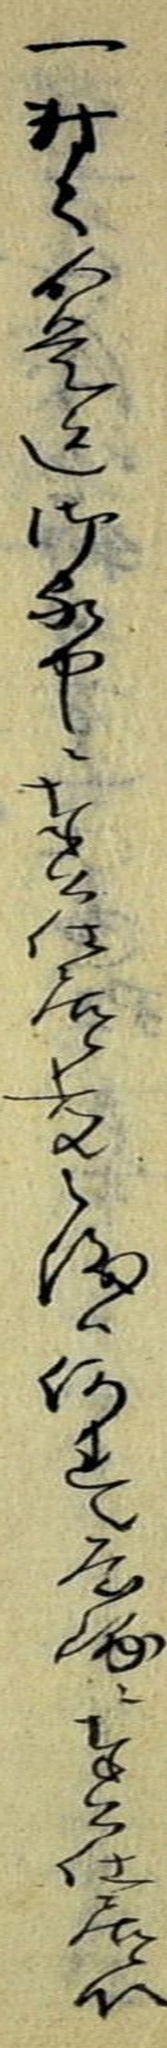一村々ゟ是迄御家中へ奉公仕居候者共之儀は何連之屋鋪に奉公仕居候段
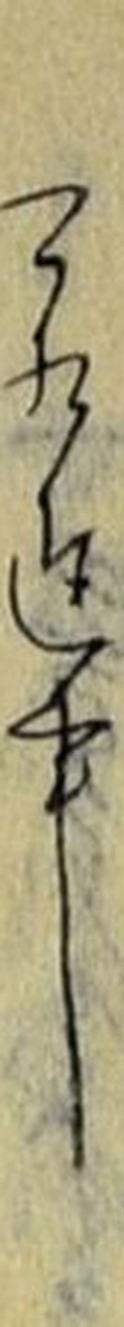可相達事
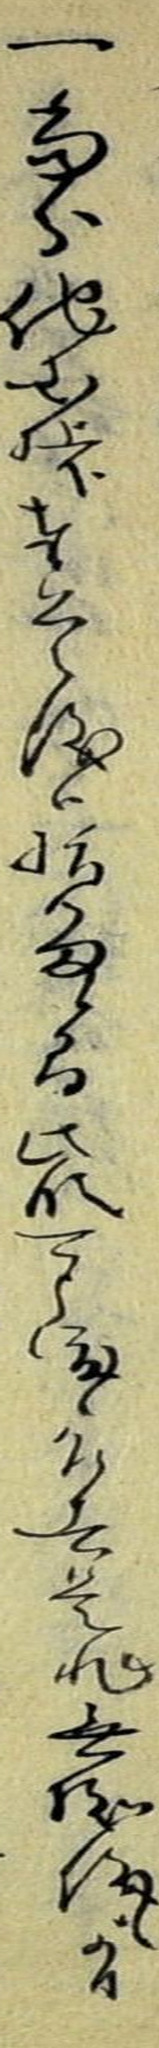一当分他国挊奉公之儀は指留候間此段可申渡候乍去是非無拠儀も有
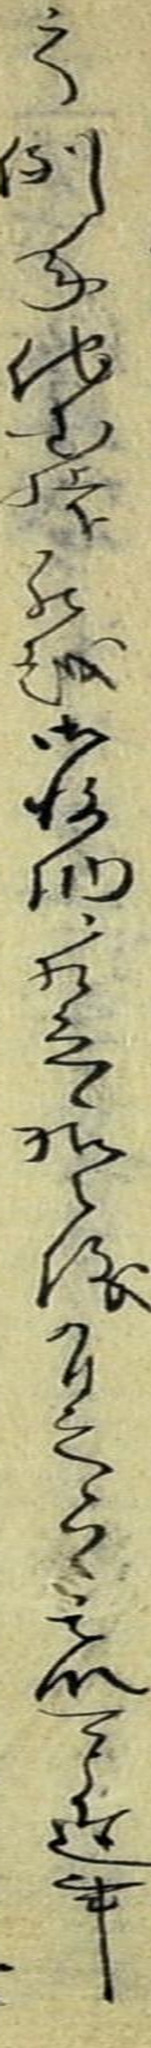之例年他国挊罷越御収納に相立候様之儀有之候はヽ其段可申達事
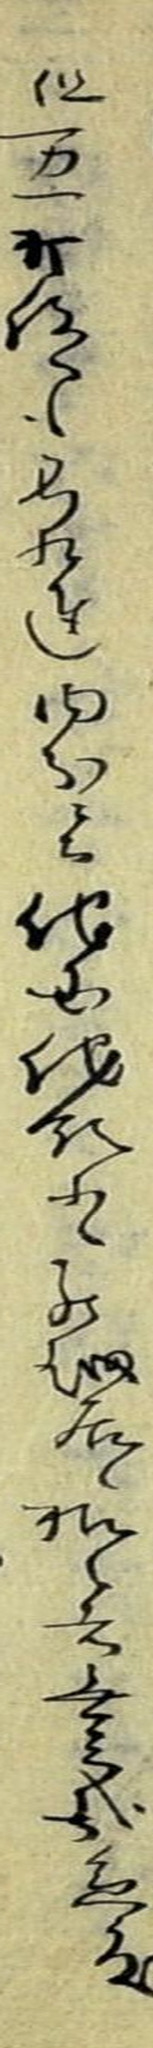但万一村役へも不相達内分に而他国他領等へ罷越居候様之者無之哉急度
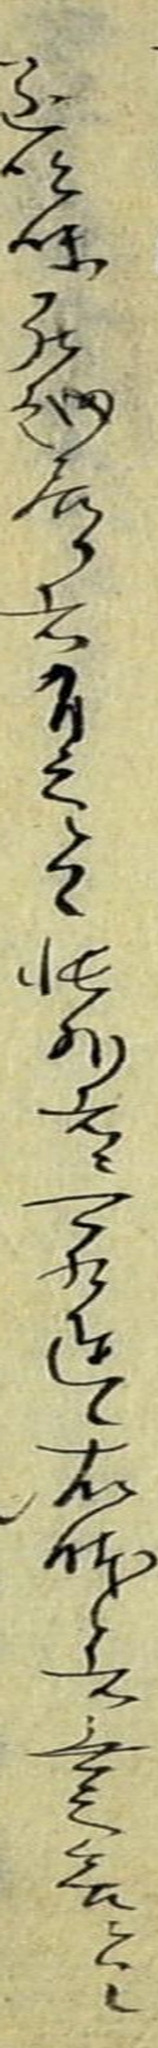遂吟味罷越居候者有之候はヽ帳外者に可相達候右体之者無之筈には候
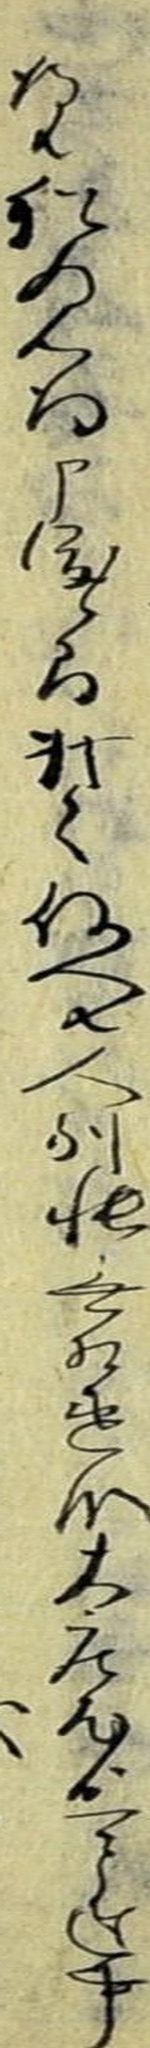得共猶為心得申渡候間村々役人共人別帳無相違段大庄屋ゟ可申達事
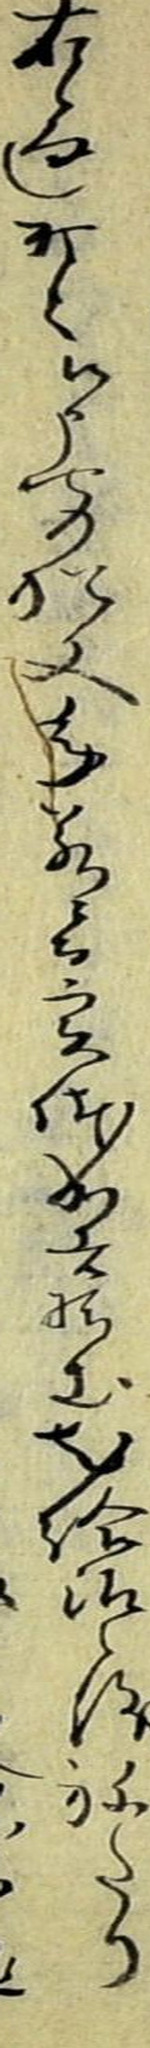右之通村々江申聞猶又年若に而実体成者指出其給銀之儀ねたり
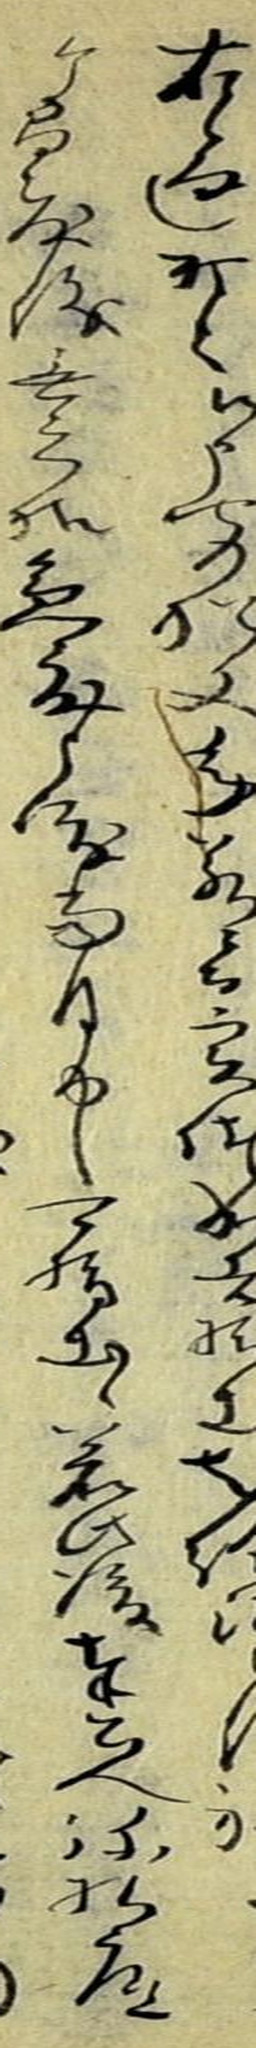ヶ間敷儀無之様急度申渡当月中可指出候若此後奉公人弥払底
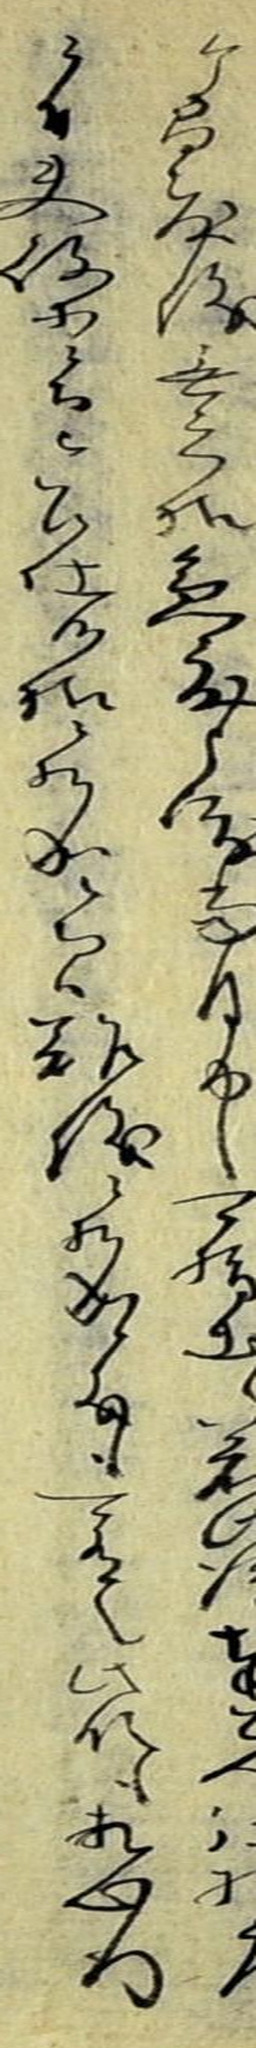に付夫役等等に而被召仕候様に相成候而は難儀に相成候義も可有之此段も相心得
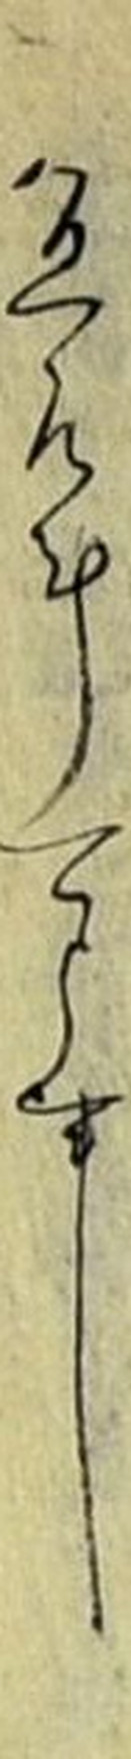宜取斗可申事
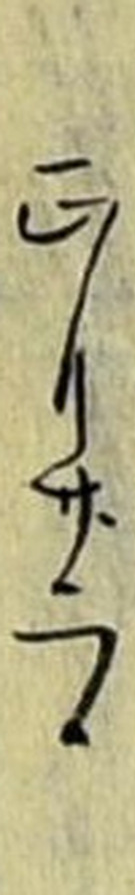正月廿二日
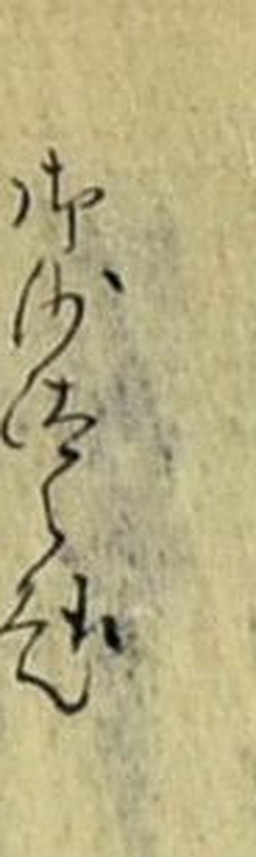御沙汰之趣
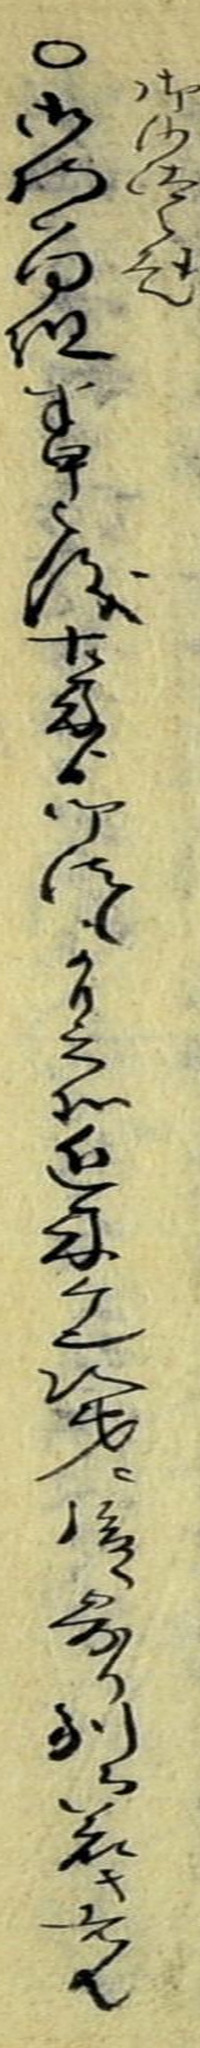○御持筒組半甲之儀古来ゟ御法も有之処近来ケン次第に後へ寄り別而若キ者共

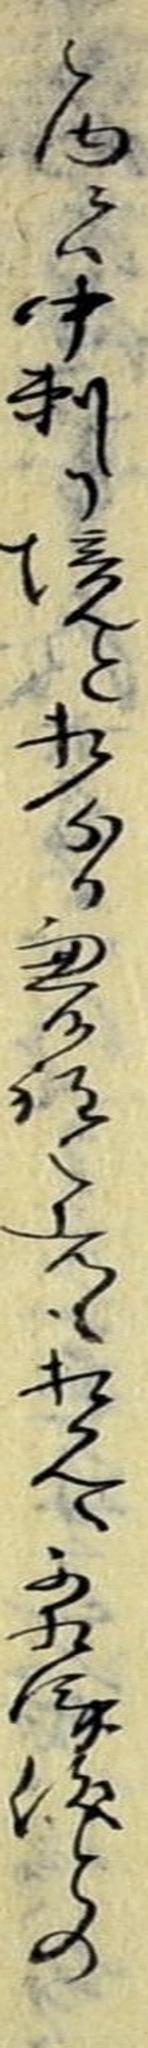之内には中剃り境と相分り兼候程之者も相見へ不相済儀との
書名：命令之部 四
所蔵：福井県文書館 Fukui Prefectural Archives
